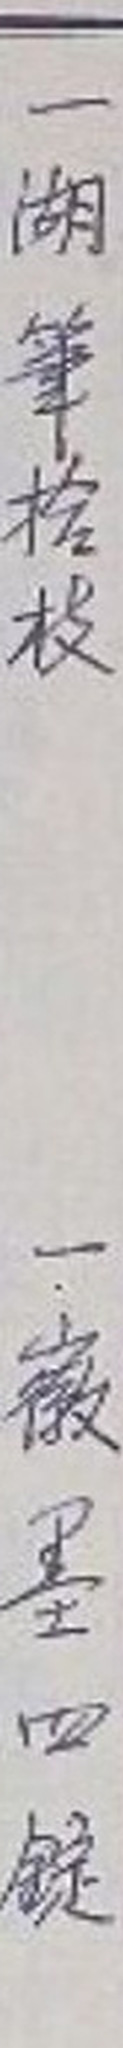一湖筆拾枝一徽墨四錠
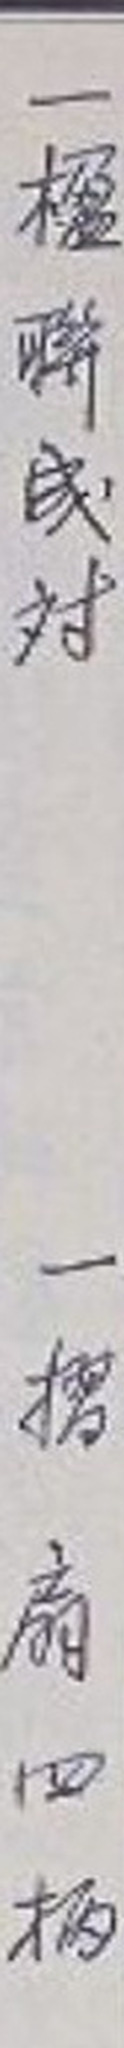一楹聯弐対一摺扇四柄
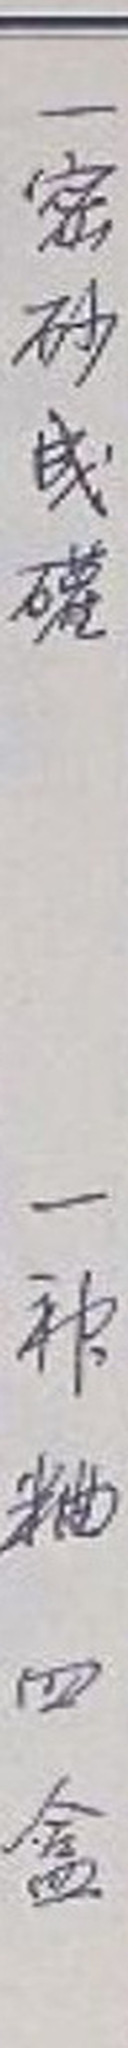一密砂成礶一神粬四盒
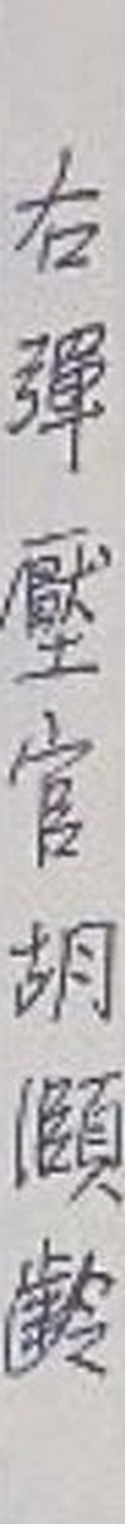右弾圧官胡頥齢
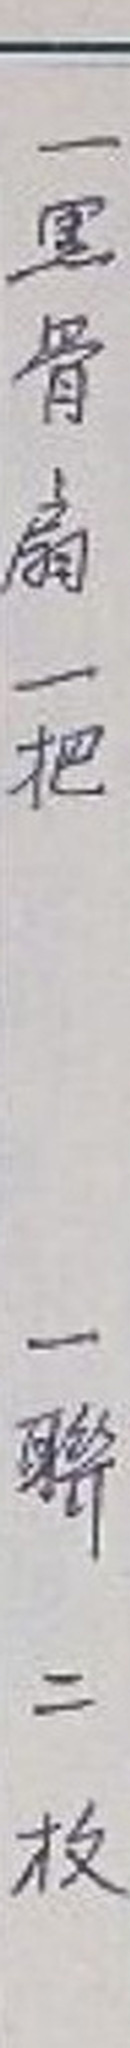一黒骨扇一把一聯二枚
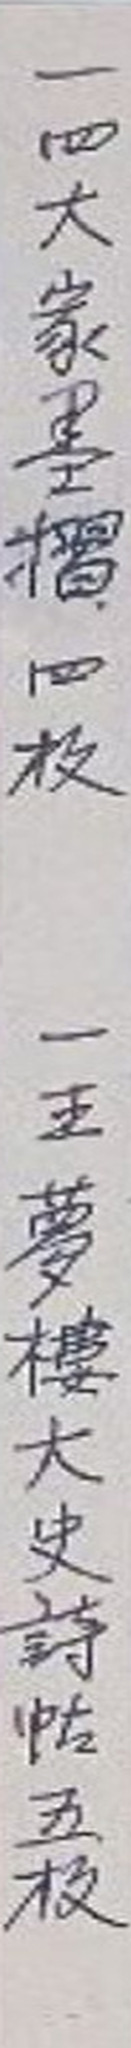一四大家墨摺四枚一王夢楼大史詩帖五枚
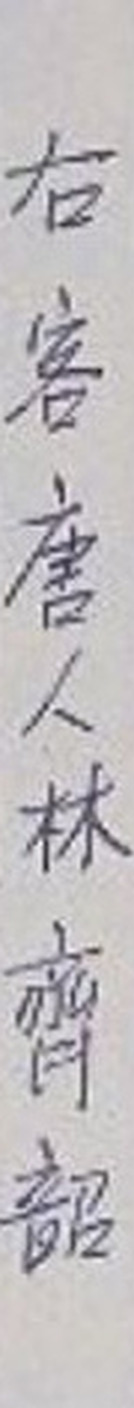右客唐人林齊韶
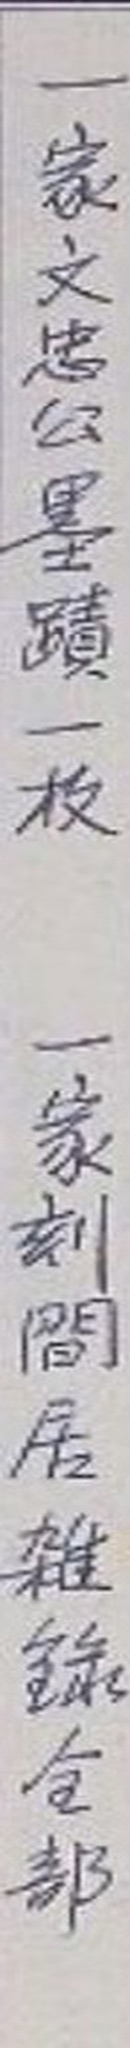一家文忠公墨蹟一枚一家刻間居雑録全部
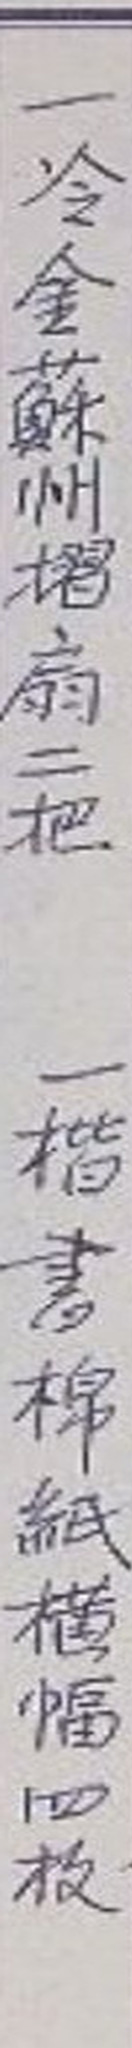一冷金蘇州摺扇二把一楷書棉紙横幅四枚
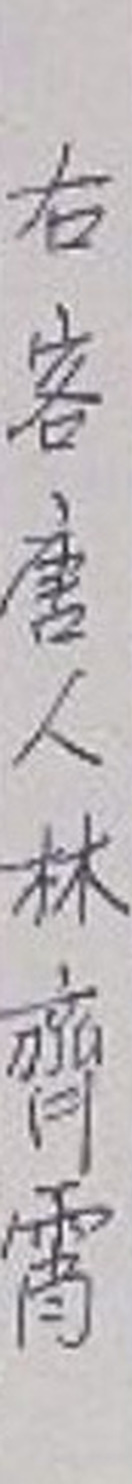右客唐人林齊韶

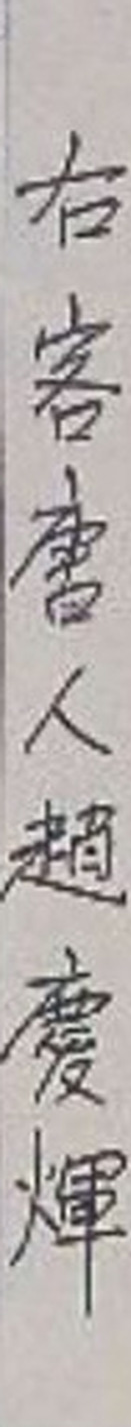右客唐人趙慶煇
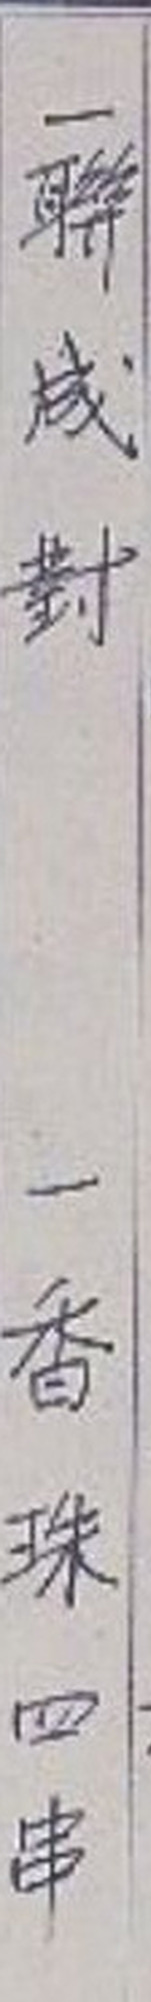一聯成対一香珠四串
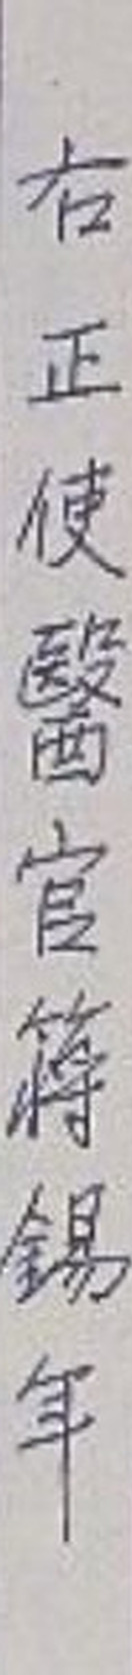右正使医官䉃錫年
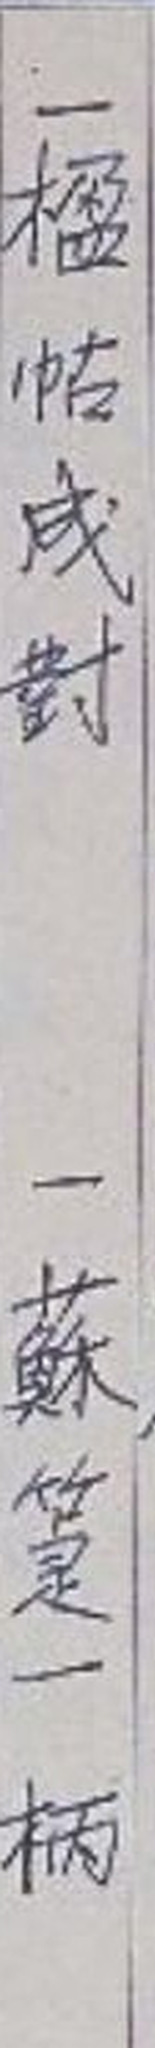一楹帖成対一蘇箑一柄
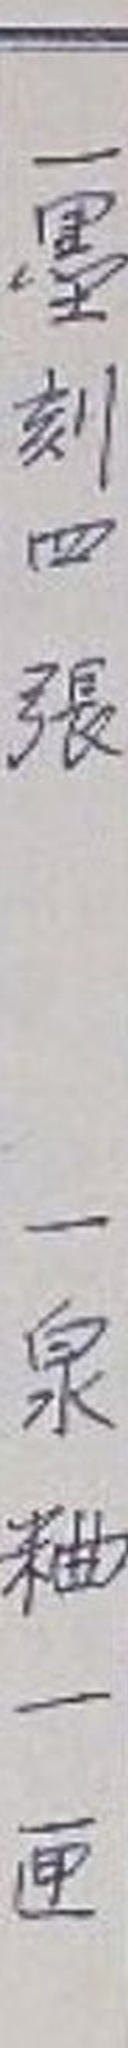一墨刻四張一泉粬一匣
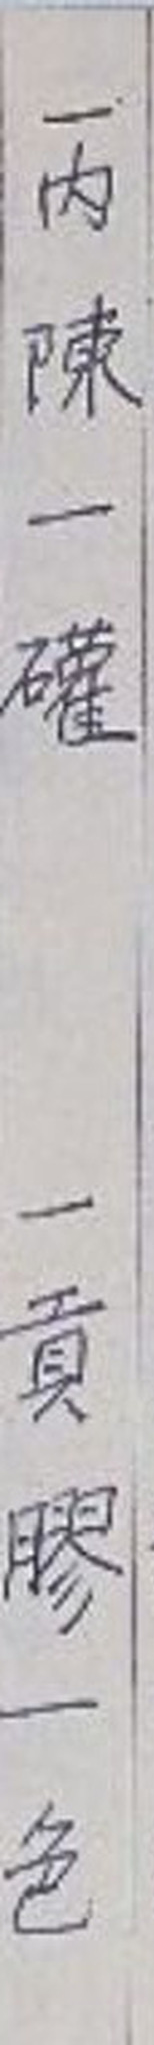一内陳一礶一貢膠一色
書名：支那冊封使来琉諸記 下巻
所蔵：University of the Ryukyus Library
